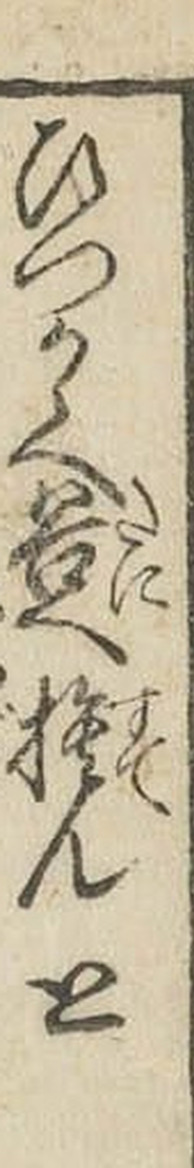ひつかゝへ谷へ捨んと
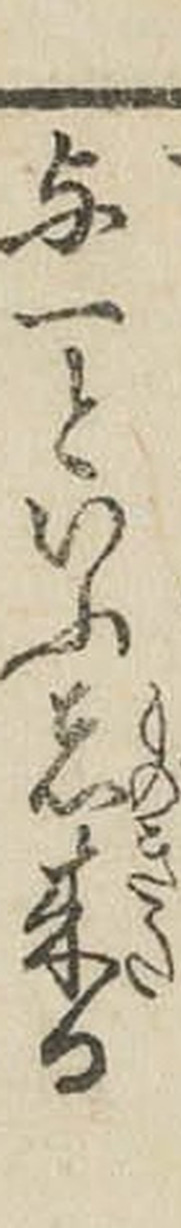与一といふ者来る
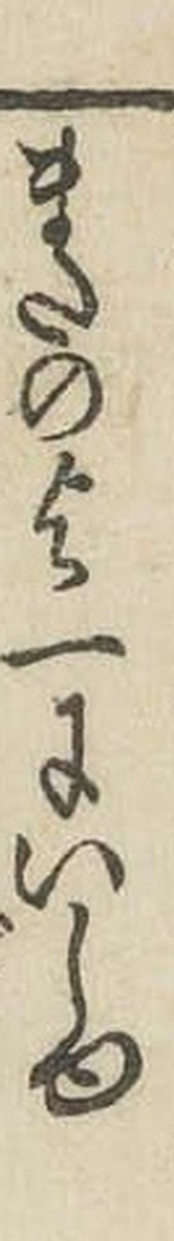またの与一にいしゆ
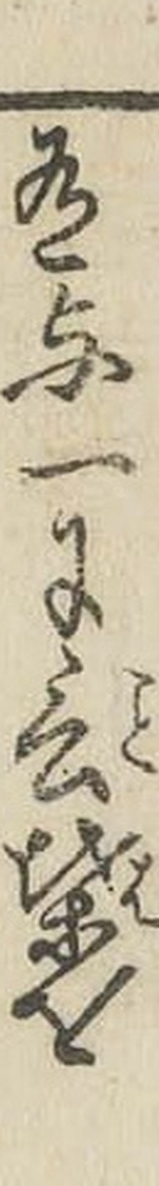有与一に言葉を
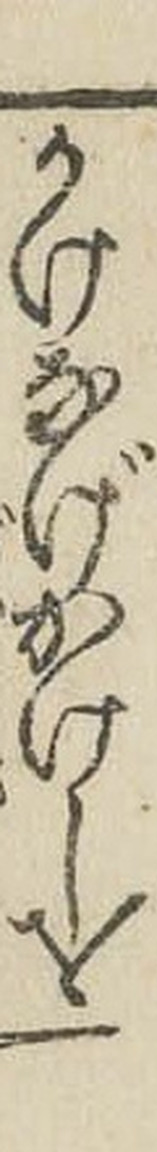かけなげかけしを
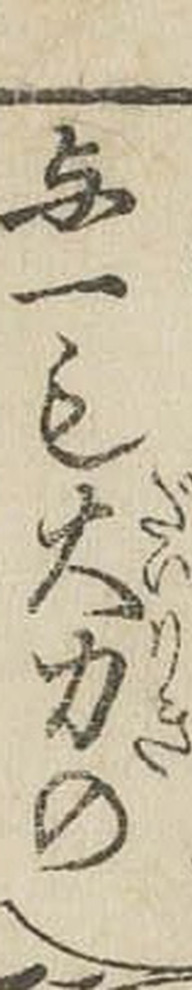与一も大力の
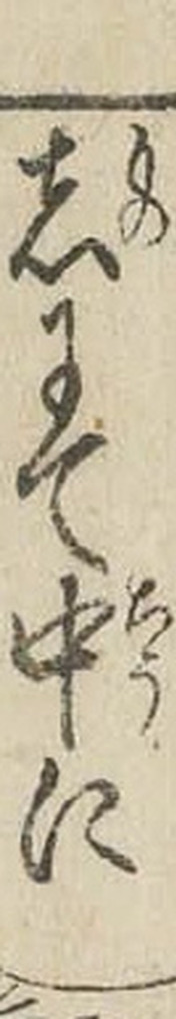者にて中に
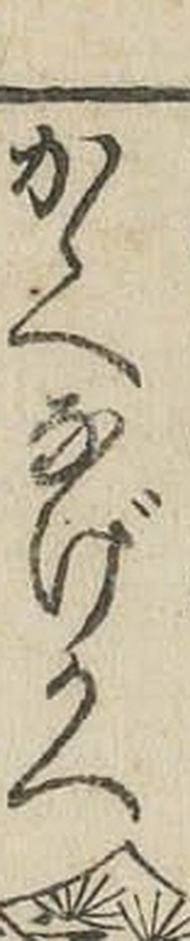かゝへなげかへ
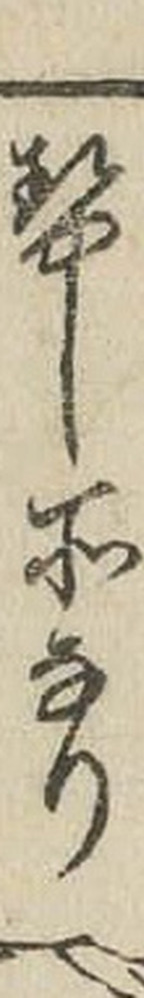せし所なり
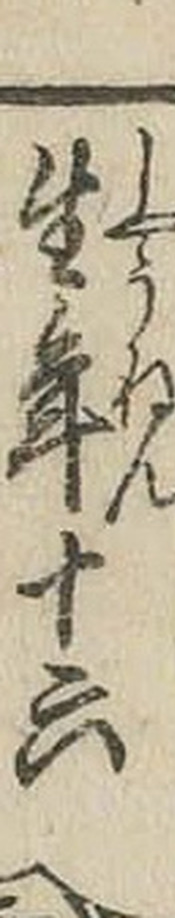生年十六
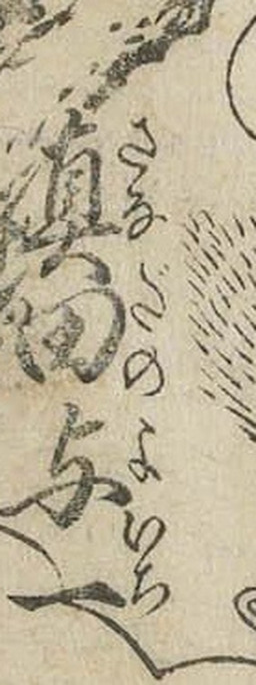真田与一
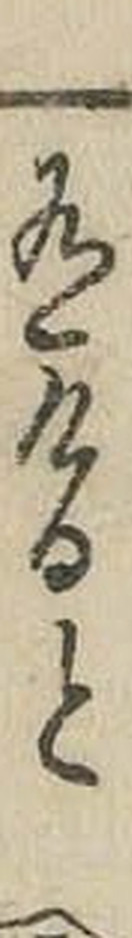有けると
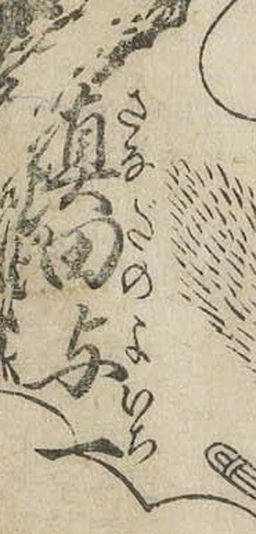真田与一

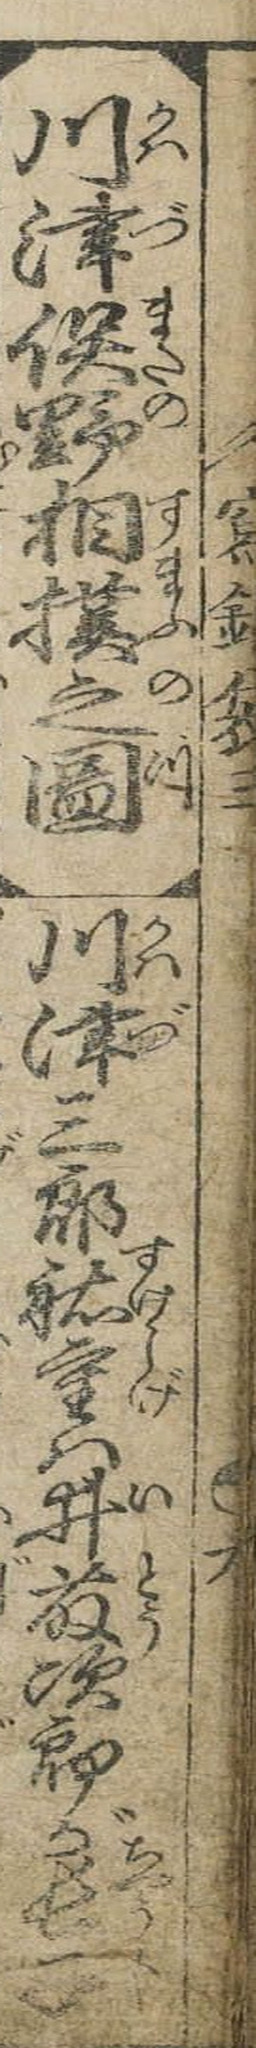川津俣野相撲之図川津三郎祐重は井藤次郎が長子
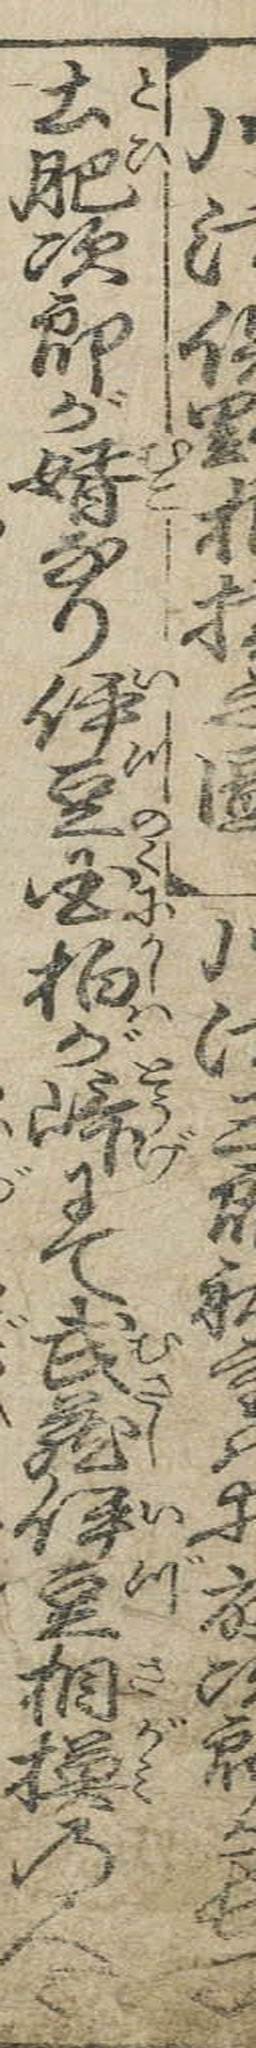土肥次郎が婿なり伊豆国柏が峠にて武蔵伊豆相模の人々
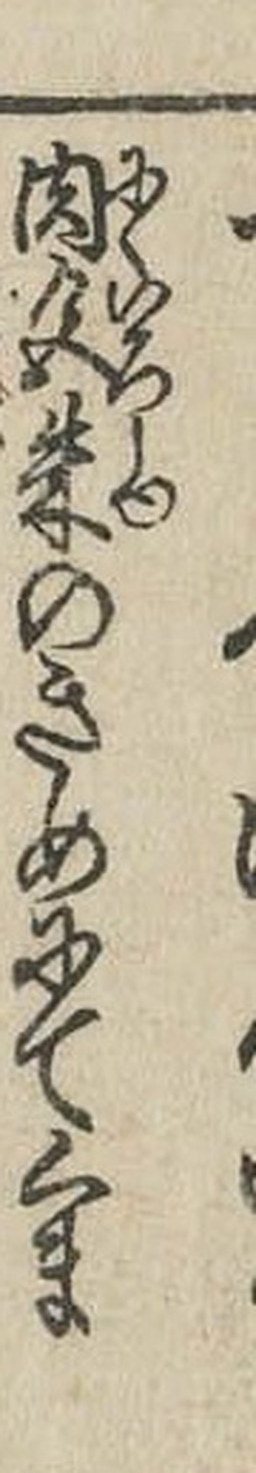肉色朱のきめにてくま
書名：絵本写宝袋 9巻 3之巻
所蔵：東京学芸大学教育コンテンツアーカイブ
